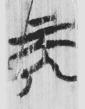而
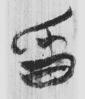昏
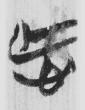忘
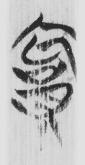{宀句貝}
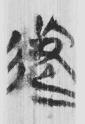﨤
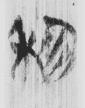利
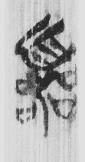囂
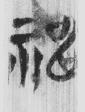神
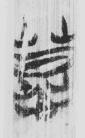慕
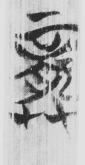龏
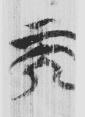而
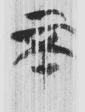不
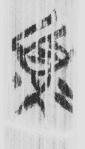寡
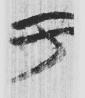于
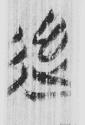後
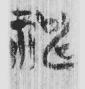神
